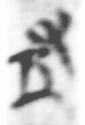○（右）
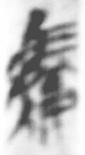○（服）
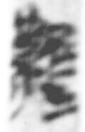○（難）
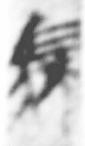駁
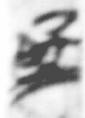爲
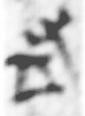○（右）
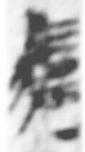驂
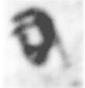司
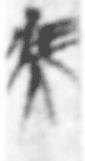馬
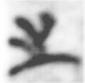之
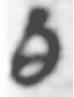白
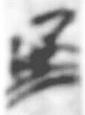爲
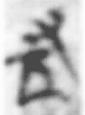○（右）
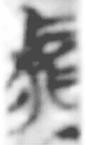飛（騑）
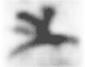之
